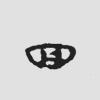四
